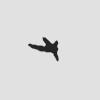又
